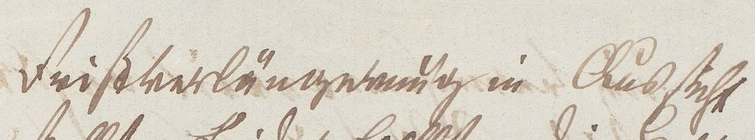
Fristverlängerung in Aussicht
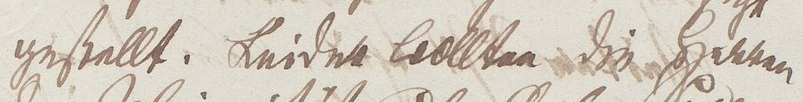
gestellt. Leider wollten die Herren
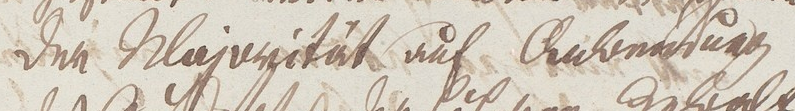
der Majorität auf Anwendung
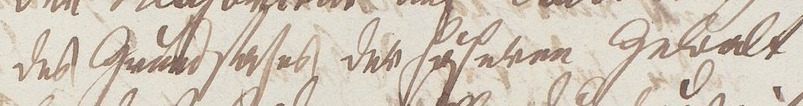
des Grundsazes der höheren Gewalt
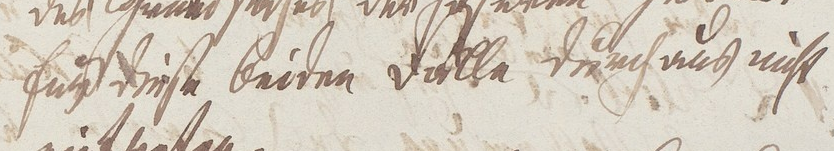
für diese beiden Fälle durchaus nicht
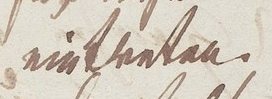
eintreten.
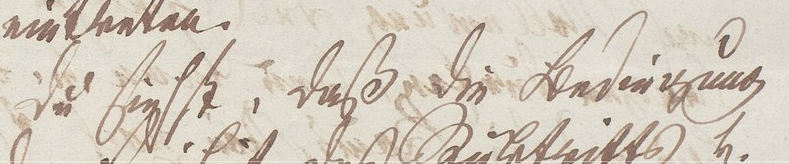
Du siehst, daß die Bedingung
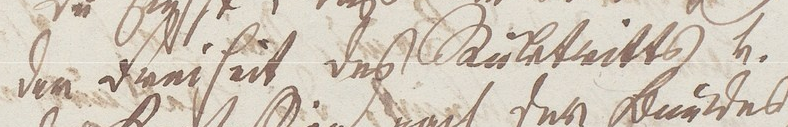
der Freiheit des Rüktritts v.
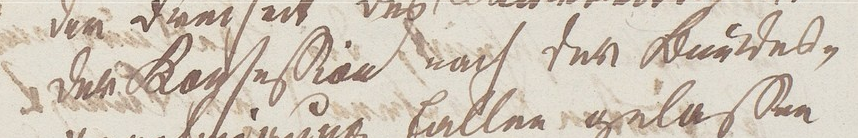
der Konzession nach der Bundes-
